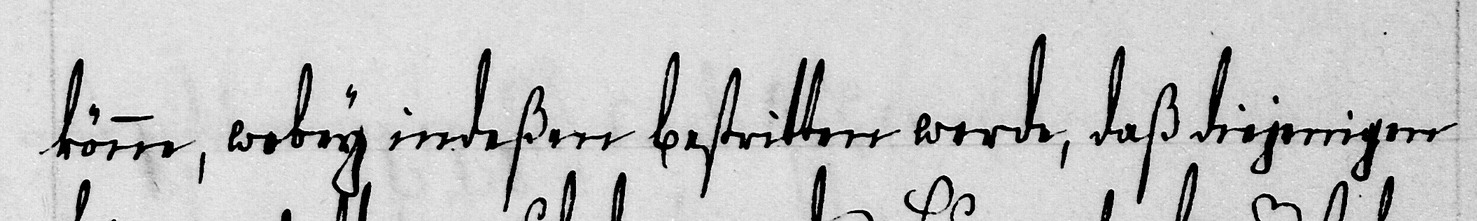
könne, wobey indeßen bestritten werde, daß diejenigen
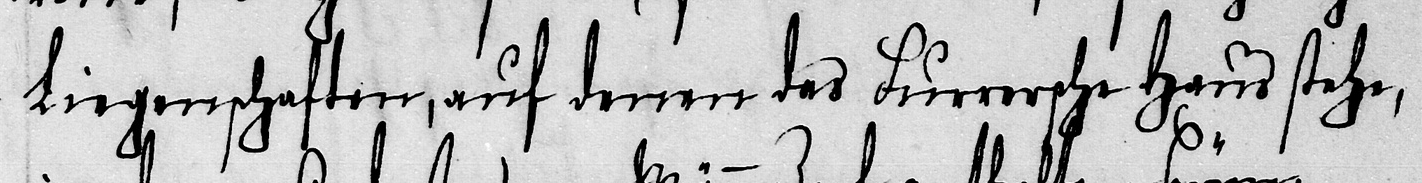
Liegenschaften, auf denen das Furrersche Haus stehe,
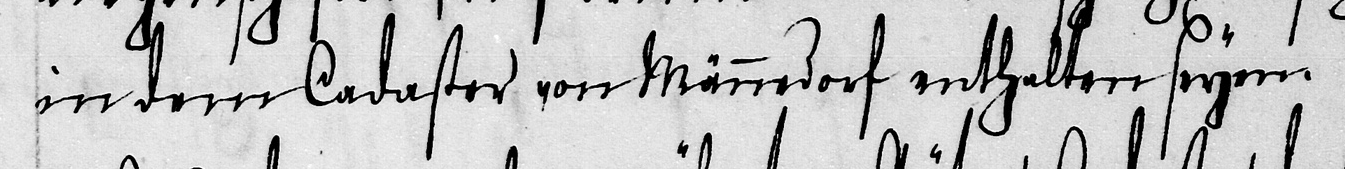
in dem Cadaster von Männedorf enthalten seyen.
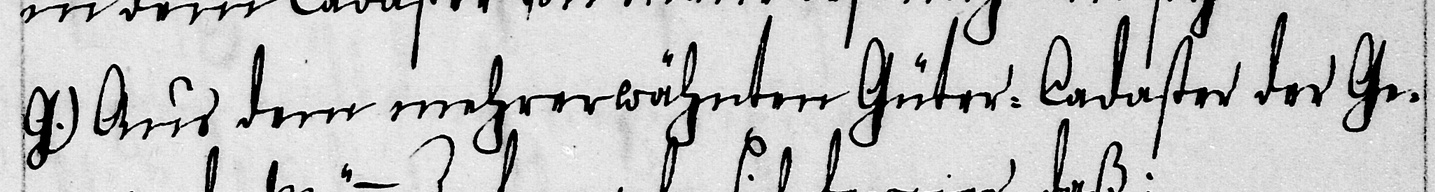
G.) Auf dem mehrerwähnten Güter-Cadaster der Ge¬
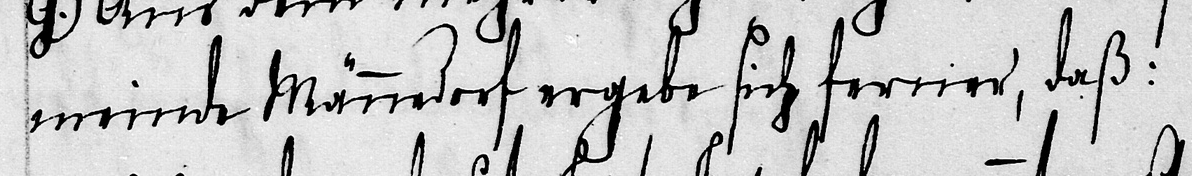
meinde Männedorf ergebe sich ferner, daß:
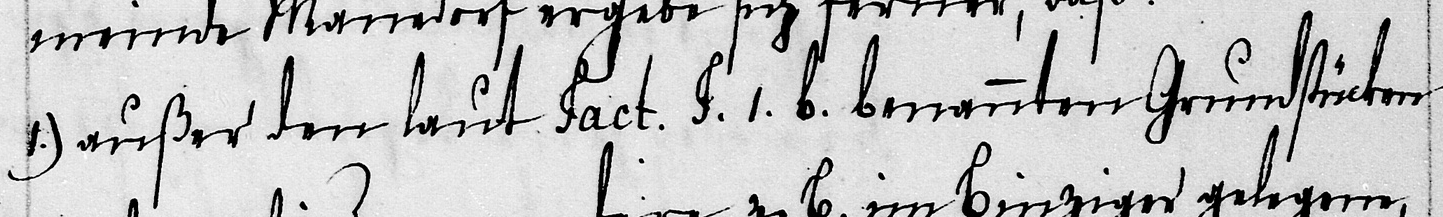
1.) außer den laut Fact. f. 1. b. benannten Grundstücken
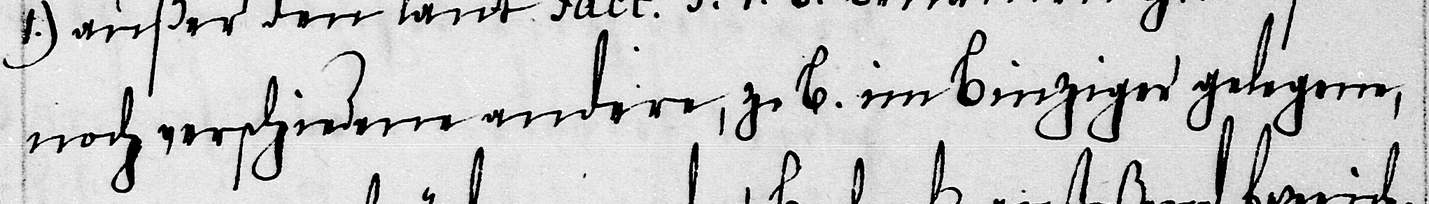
noch verschiedene andere, z. B. im Binziger gelegene,
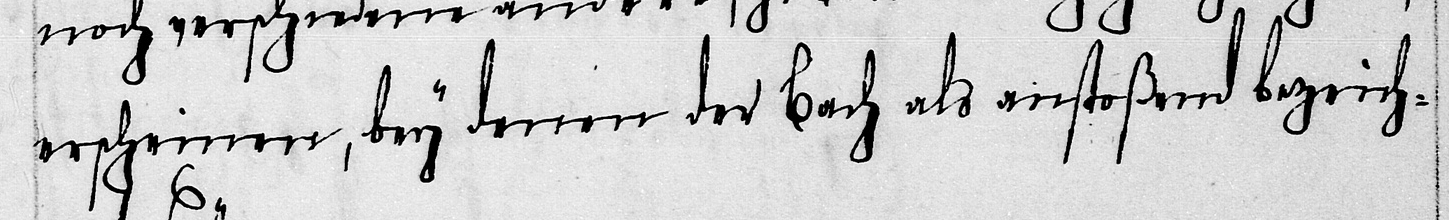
erscheinen, bey denen der Bach als anstoßend bezeich¬
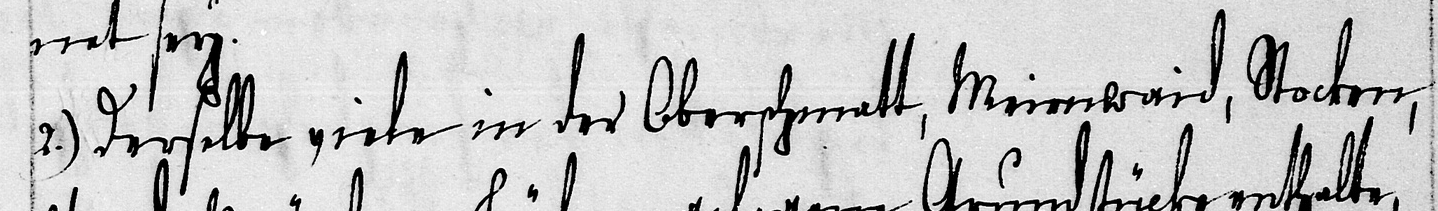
2.) Derselbe viele in der Oberschmatt, Meienwaid, Stocken,
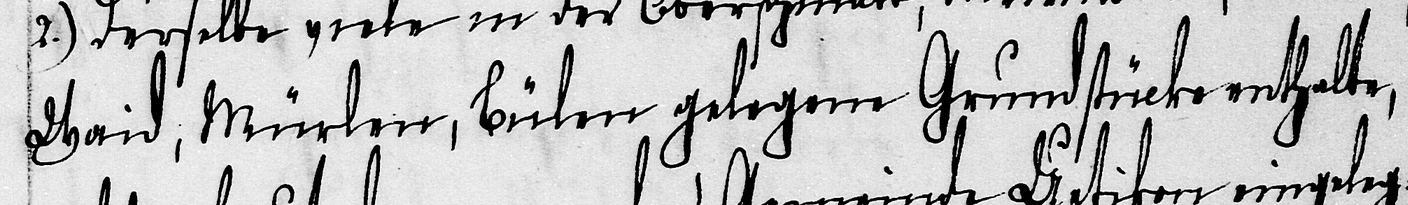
Waid, Mürlen, Bülen gelegene Grundstücke enthalte,
